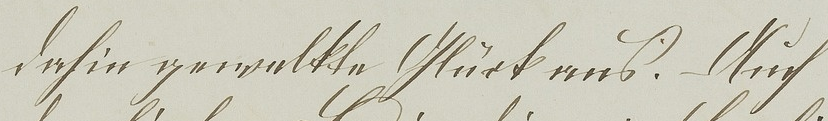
dahin gewelkte Glück aus. – Auch
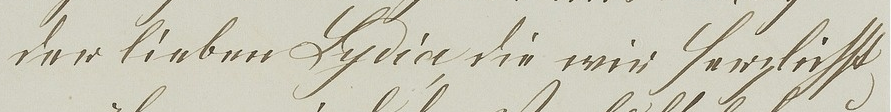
der lieben Lydia, die wir herzlichst
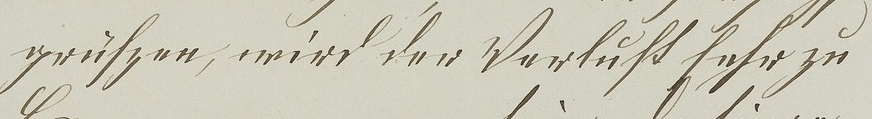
grüszen, wird der Verlust sehr zu
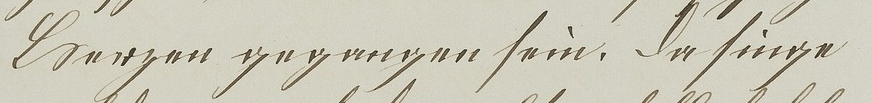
Herzen gegangen sein. Da singe
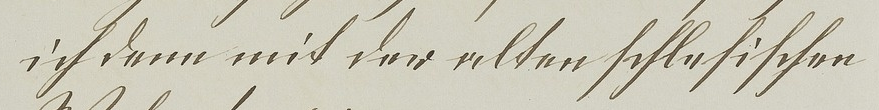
ich dann mit der alten schlesischen
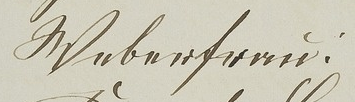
Weberfrau:
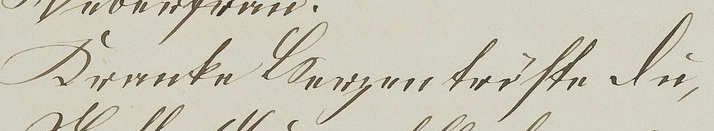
Kranke Herzen tröste Du,
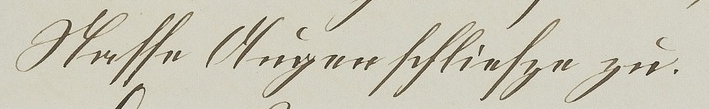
Nasse Augen schliesze zu.
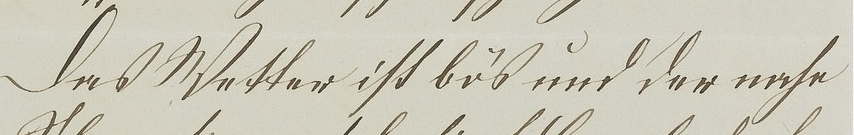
Das Wetter ist bös und der nahe
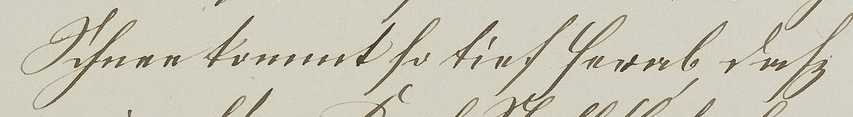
Schnee kommt so tief herab, dasz
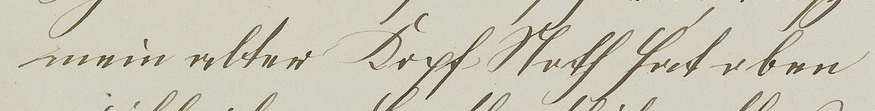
mein alter Kopf Noth hat oben
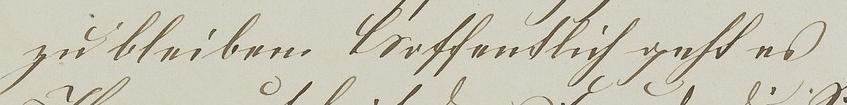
zu bleiben. Hoffentlich geht es
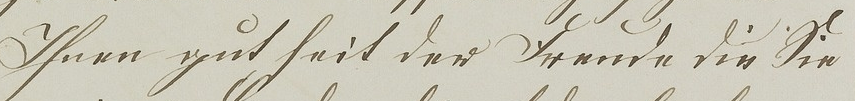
Ihnen gut seit der Freude die Sie
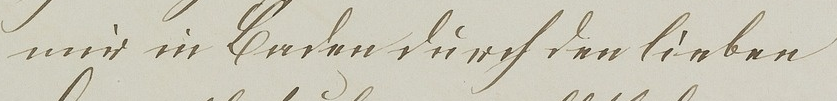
mir in Baden durch den lieben
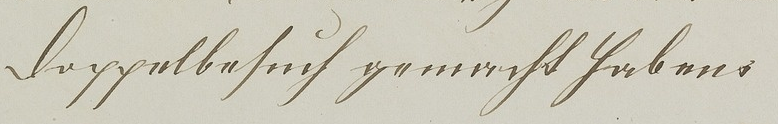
Doppelbesuch gemacht haben.
